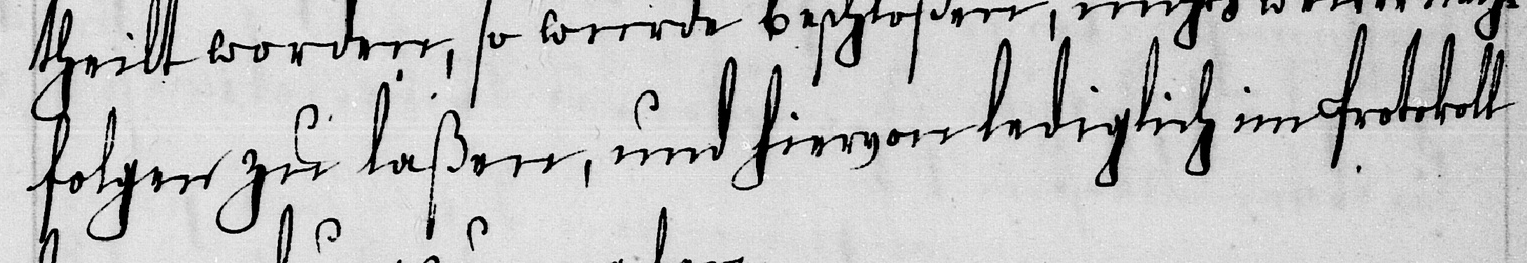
folgen zu laßen, und hiervon lediglich im Protok¬
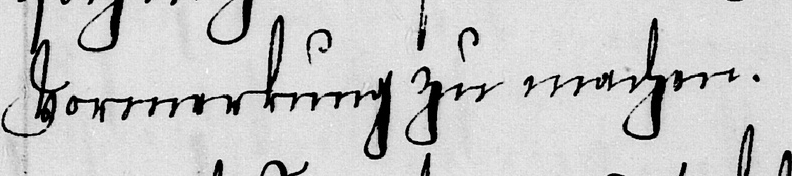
Vormerkung zu machen.
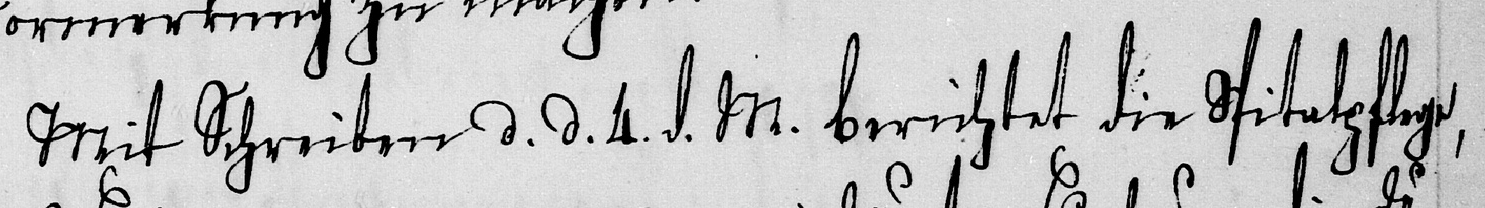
Mit Schreiben d. d. 4. d. M. berichtet die Spitalpflege,
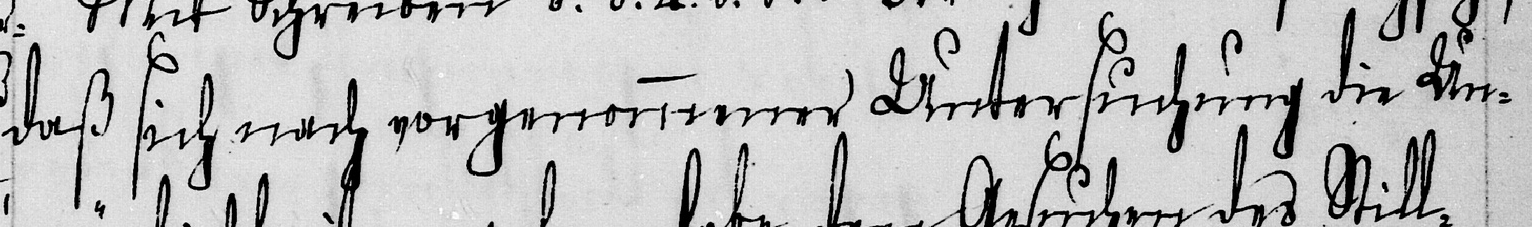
daß sich nach vorgenommener Untersuchung die Un¬
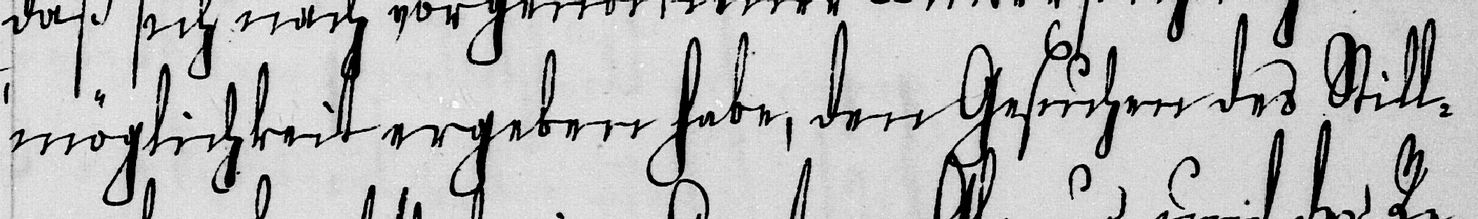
möglichkeit ergeben habe, den Gesuchen des Still¬
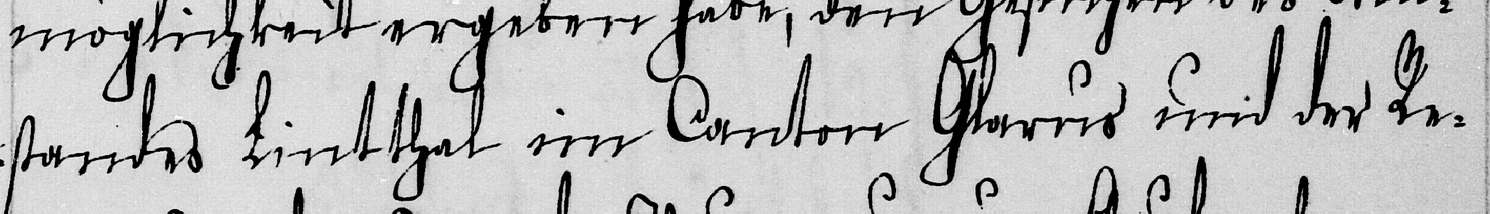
tandes Lintthal um Canton Glarus und der Re¬
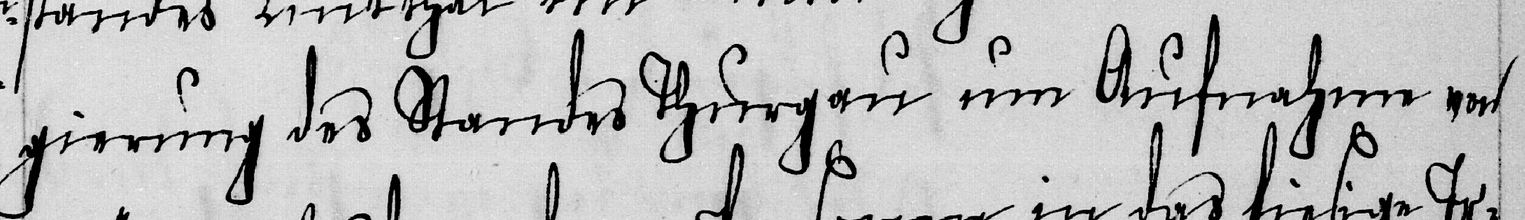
gierung des Standes Thurgau um Aufnahme von
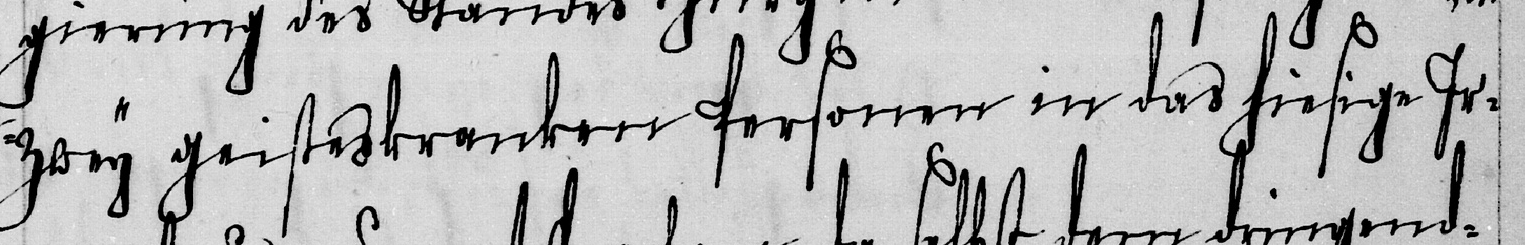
zwey geisteskranken Personen in das hiesige Ir¬
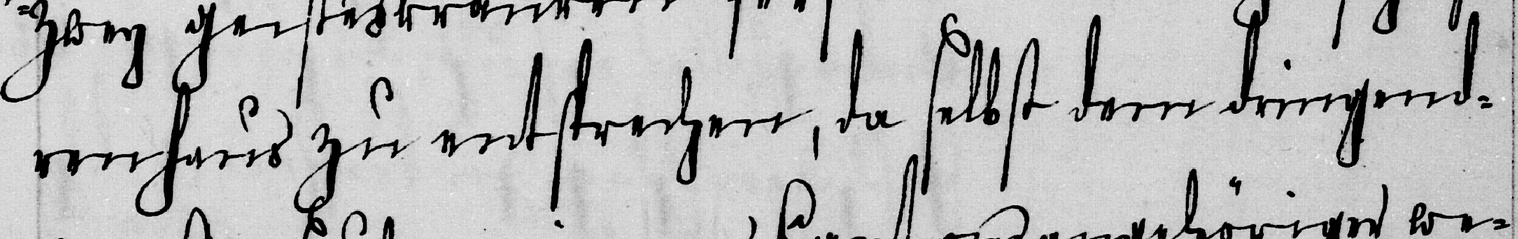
renhaus zu entsprechen, da selbst dem dringend¬
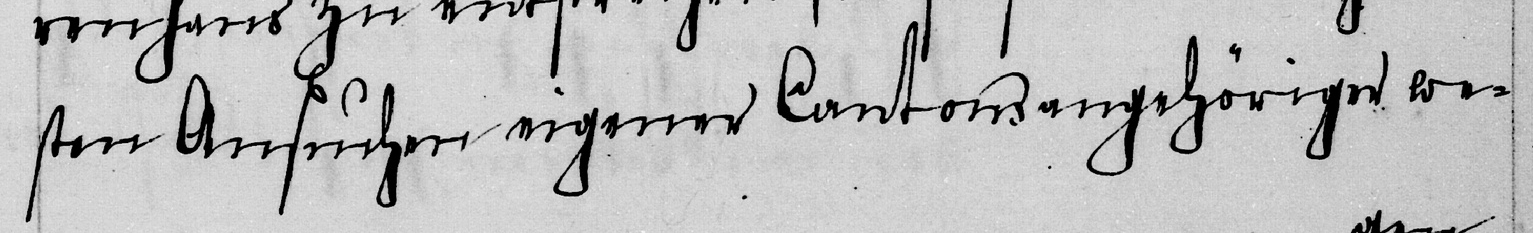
sten Ansuchen eigener Cantonsangehöriger we-
